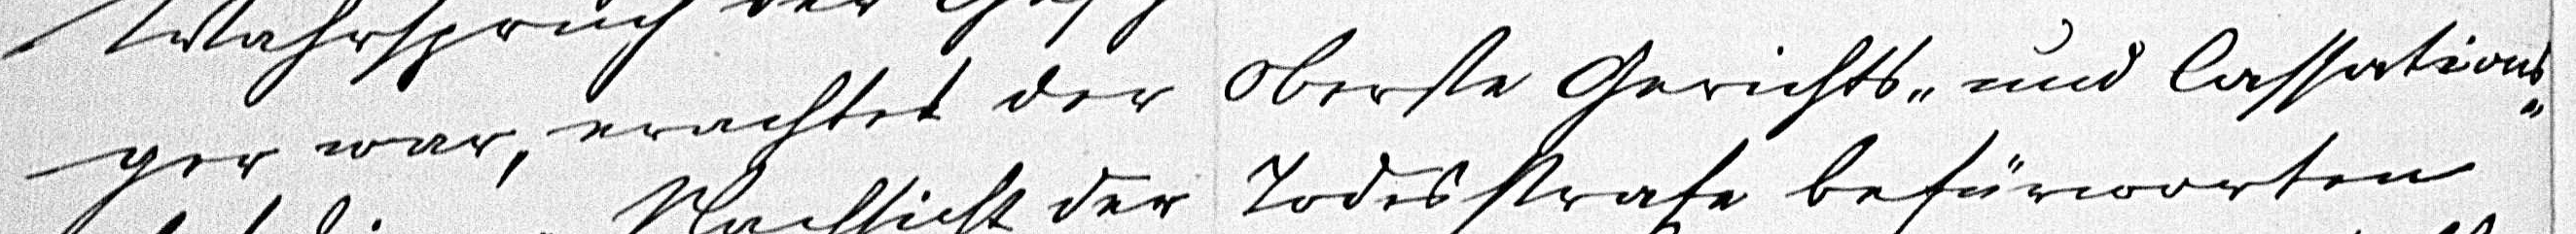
ger war, erachtet der Oberste Gerichts- und Cassations¬
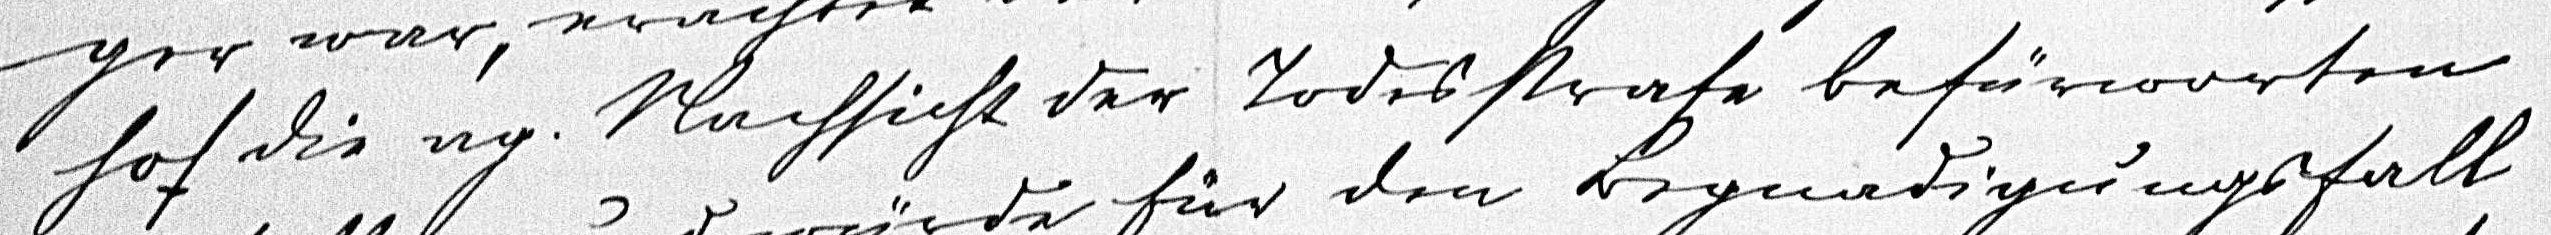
hof die ag. Nachsicht der Todesstrafe befürworten
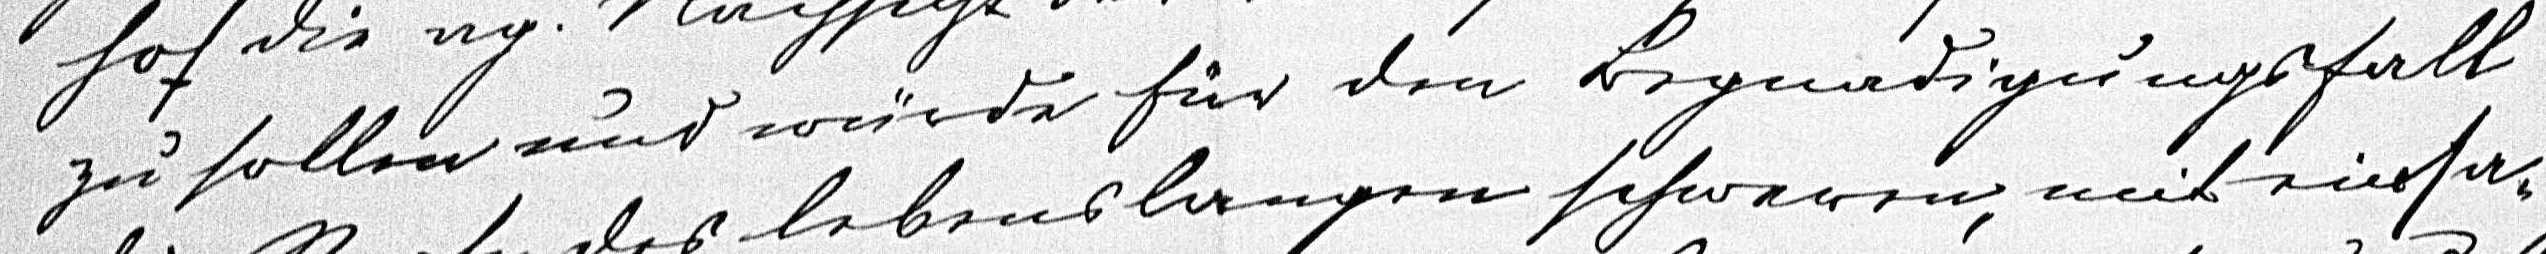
zu sollen und würde für den Begnadigungsfall
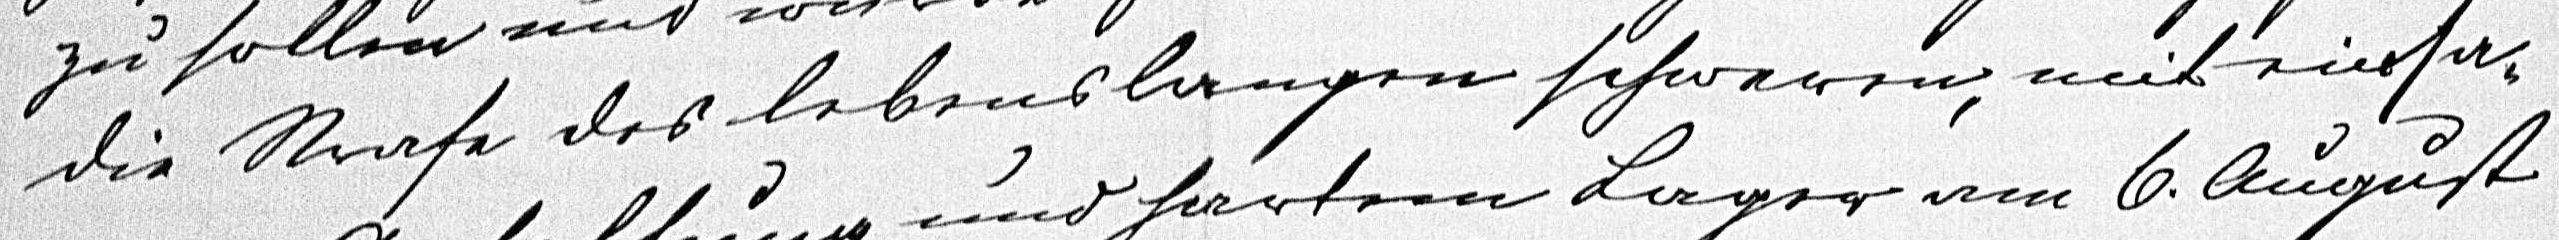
die Strafe des lebenslangen schweren, mit einsa¬
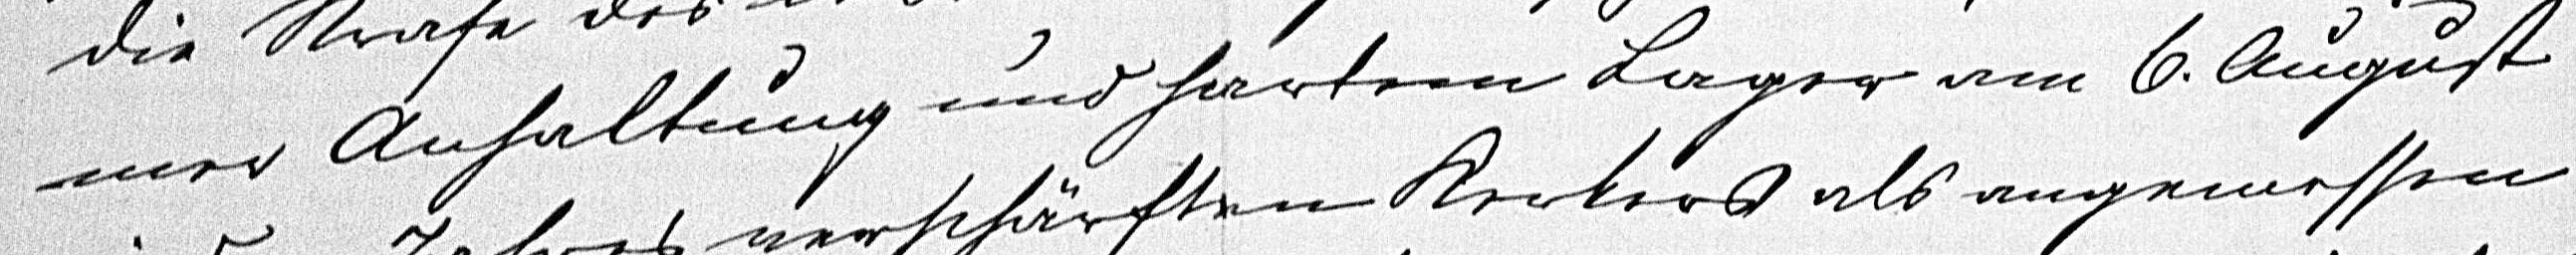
er Anhaltung und hartem Lager am 6. August
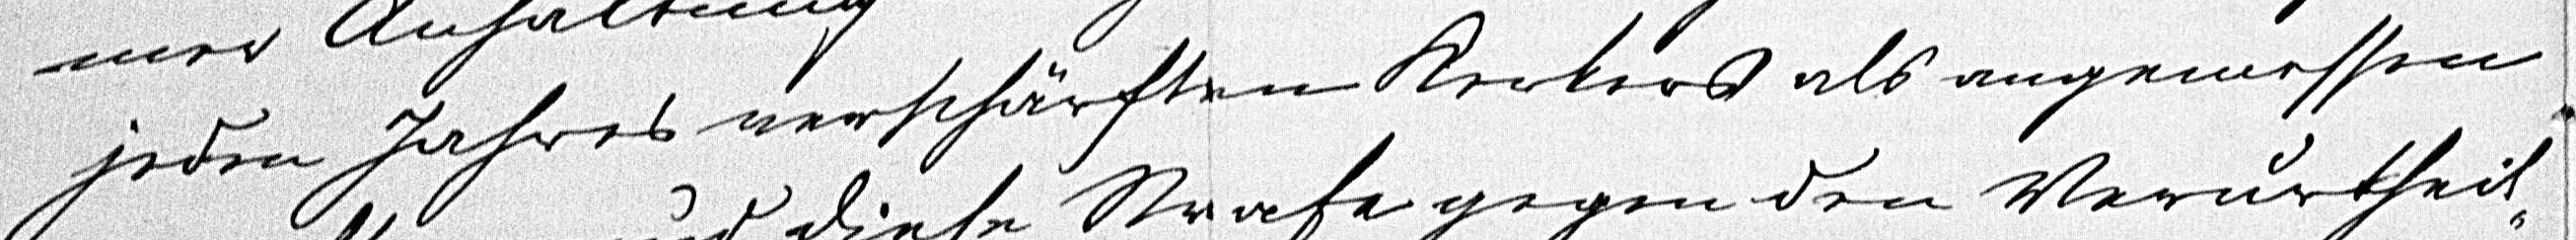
jeden Jahres verschärften Kerkers als angemessen
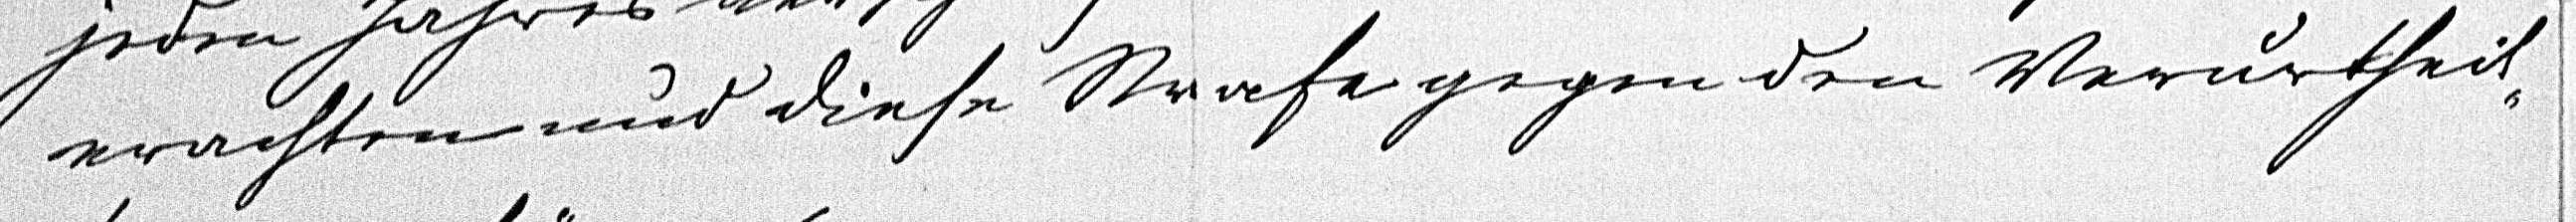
erachten und diese Strafe gegen den Verurtheil¬
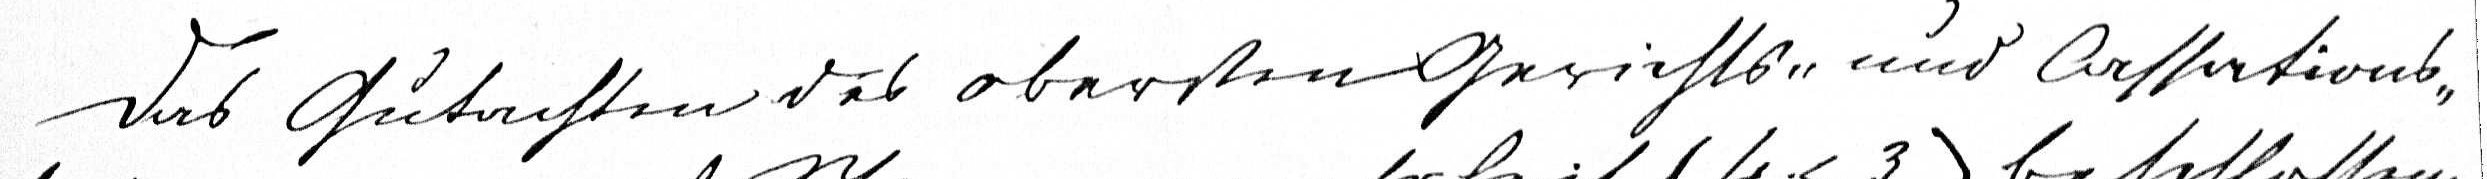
Das Gutachten des Obersten Gerichts- und Cassations¬
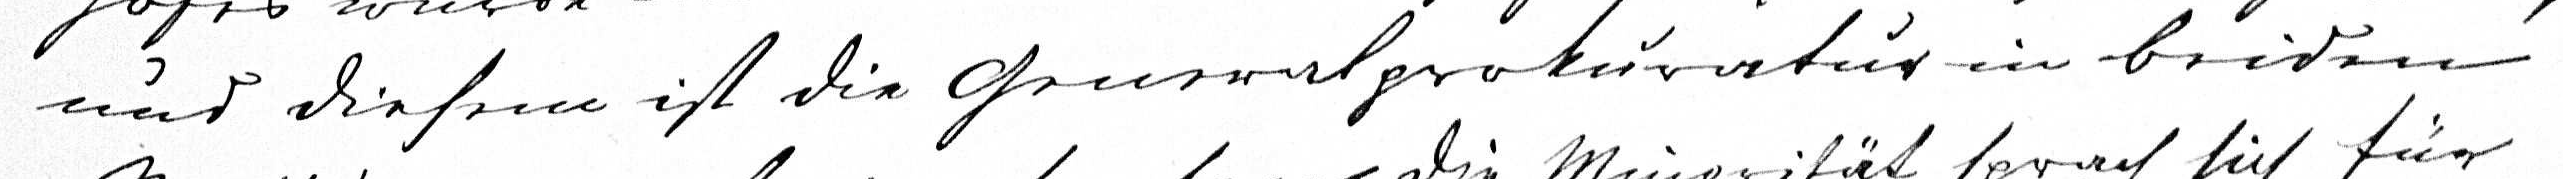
und diesem ist die Generalprokuratur in beiden
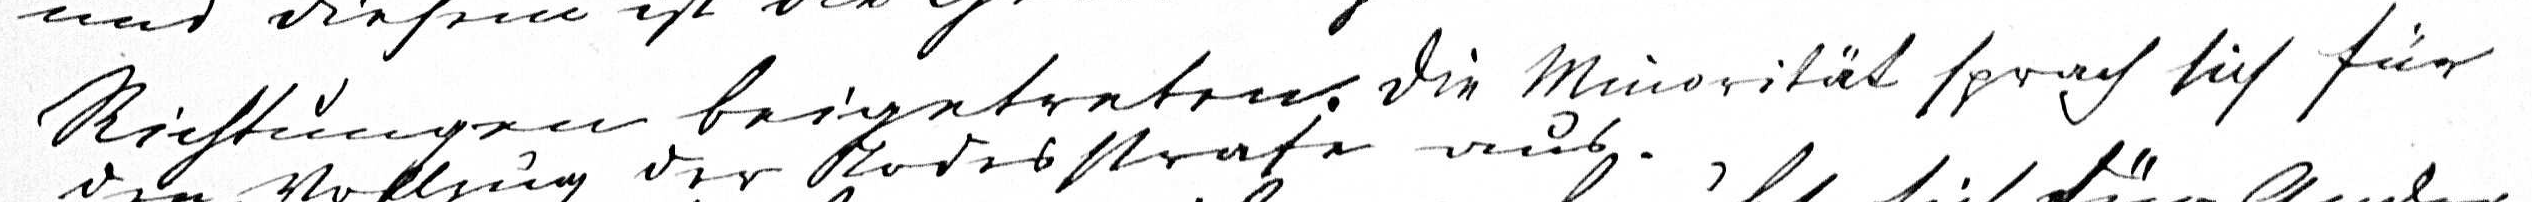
Richtungen beigetreten. Die Minorität sprach sich für
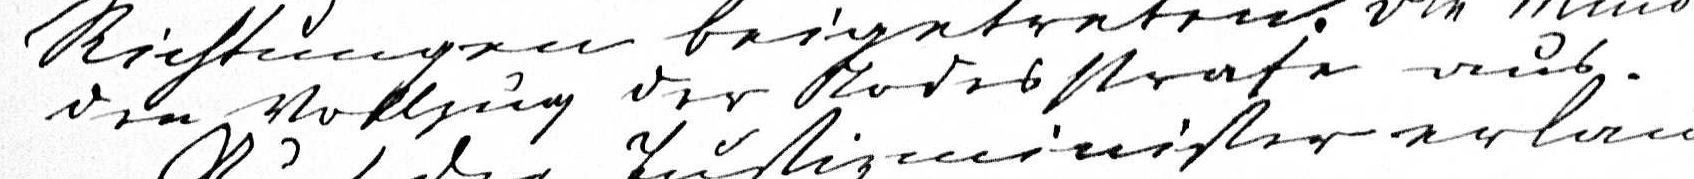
den Vollzug der Todesstrafe aus.
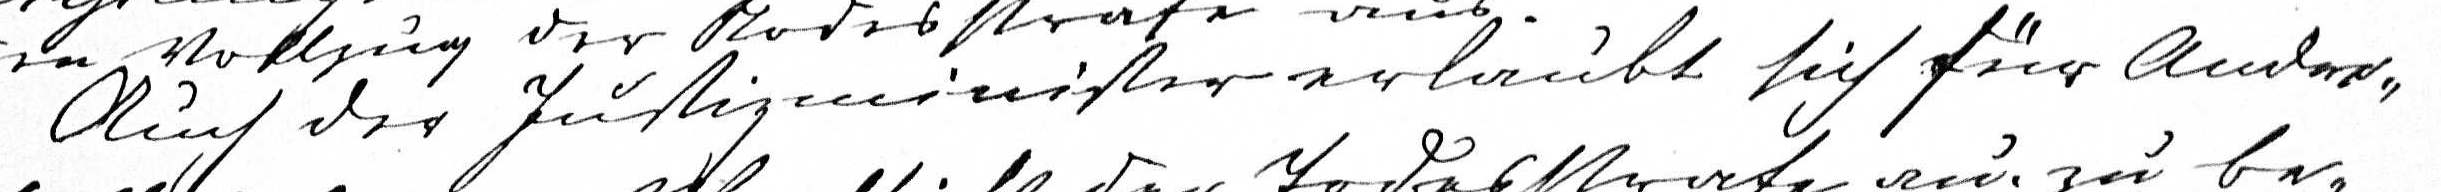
Auch der Justizminister erlaubt sich für Andre¬
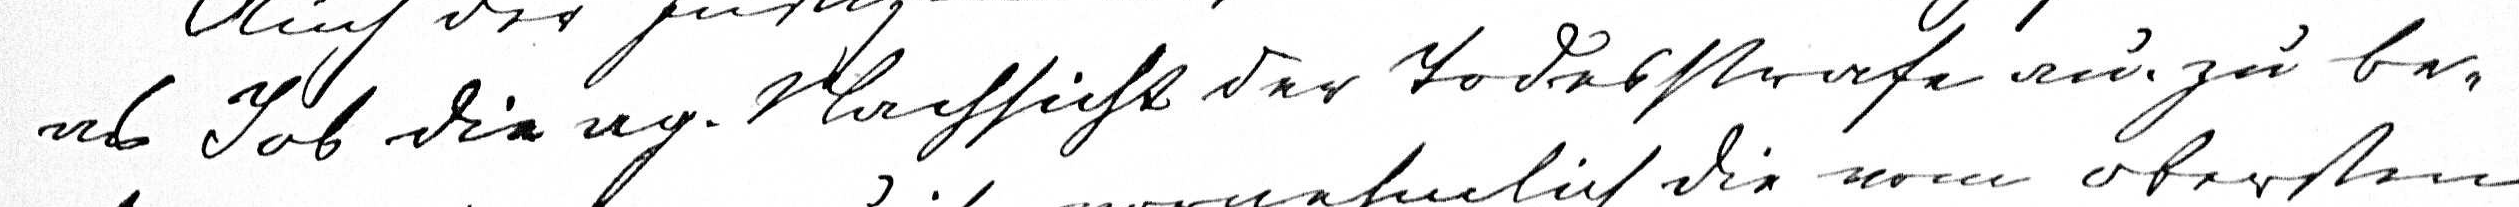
as Job die ag. Nachsicht der Todesstrafe au. zu be¬
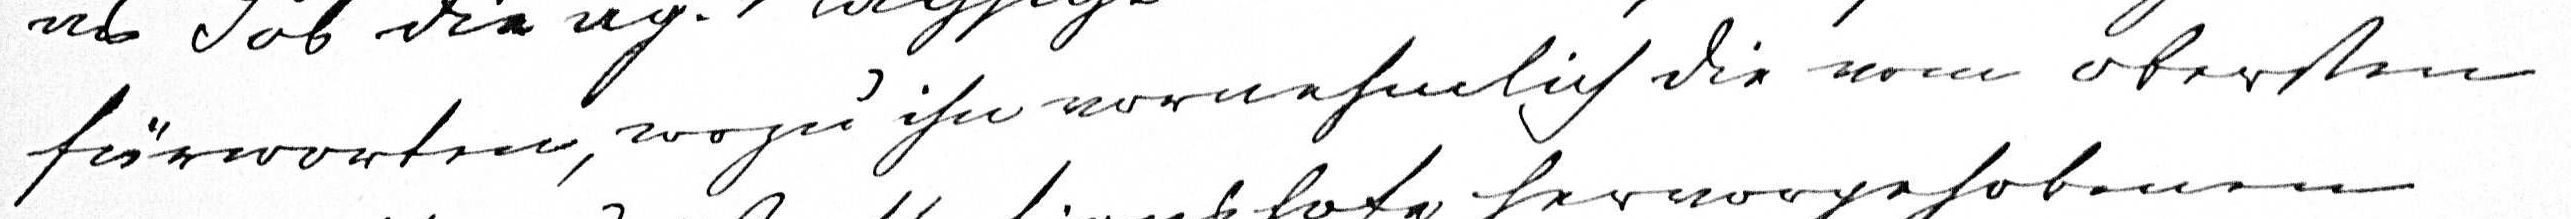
fürworten, wozu ihn vornehmlich die vom Obersten
